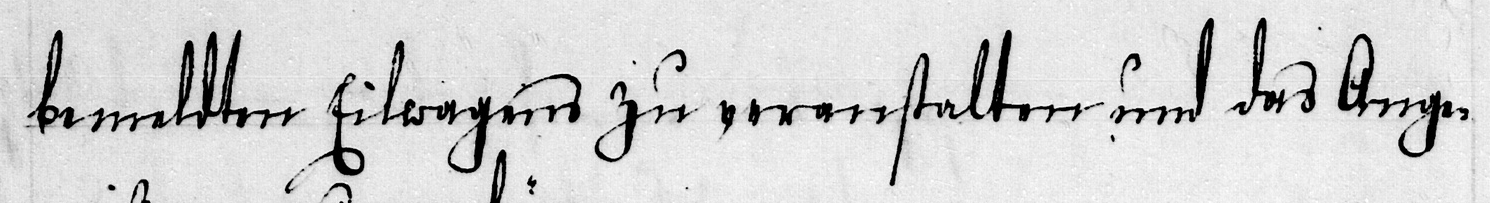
bemeldten Eilwagens zu veranstalten und das Ange¬
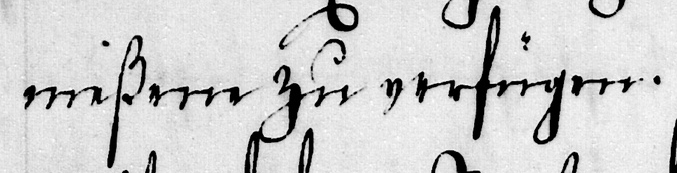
meßene zu verfügen.
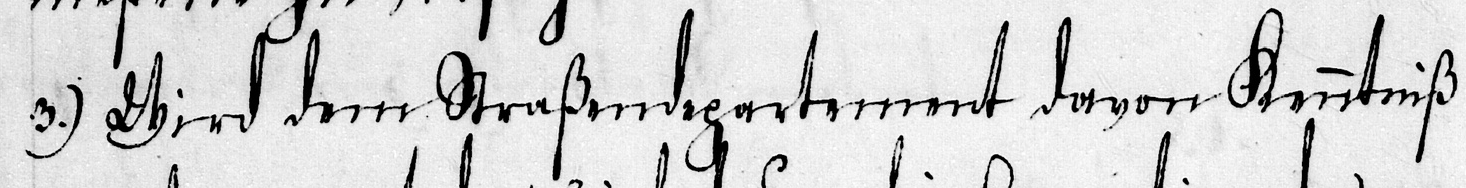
3.) Wird dem Straßendepartement davon Kenntniß
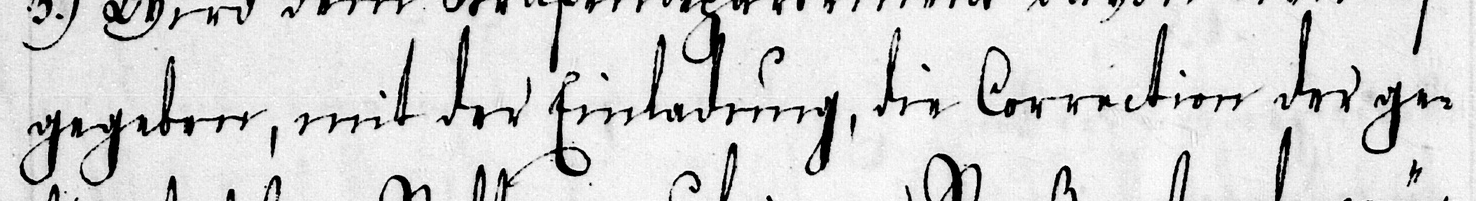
gegeben, mit der Einladung, die Correction der ge¬
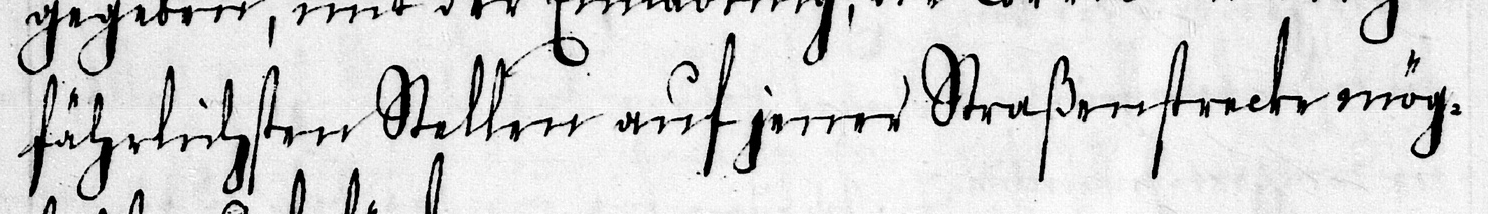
fährlichsten Stellen auf jener Straßenstrecke mög¬
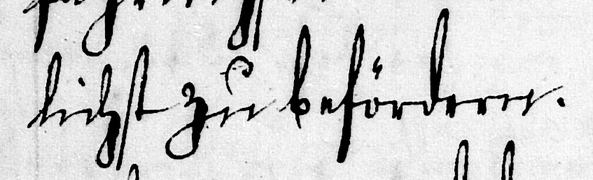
lichst zu befördern.
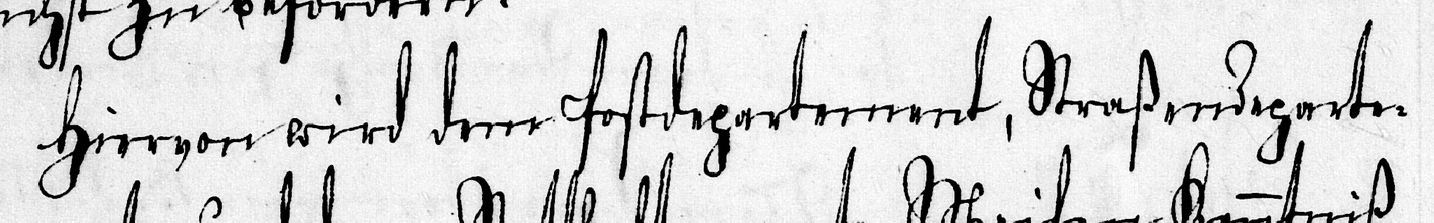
Hiervon wird dem Postdepartement, Straßendeparte¬
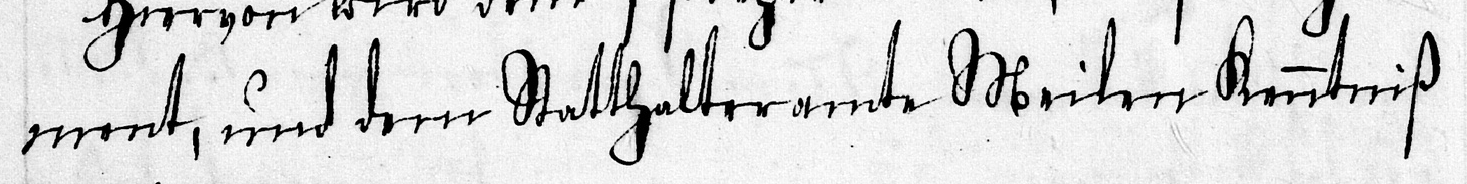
ment, und dem Statthalteramte Meilen Kenntniß
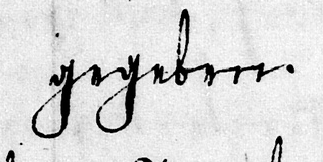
gegeben.
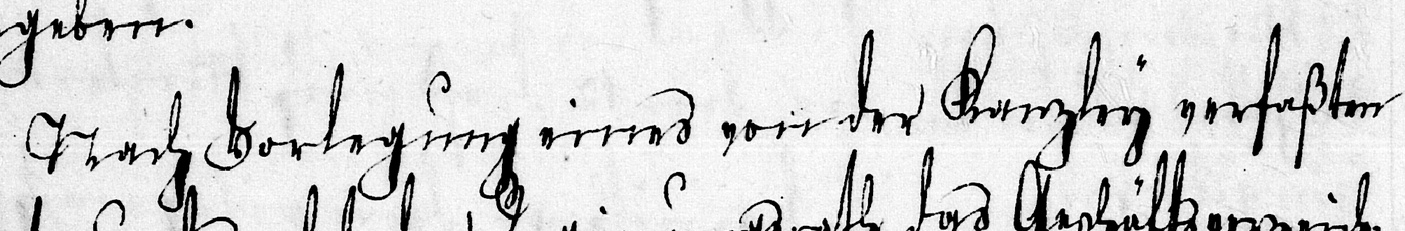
Nach Vorlegung eines von der Kanzley verfaßten
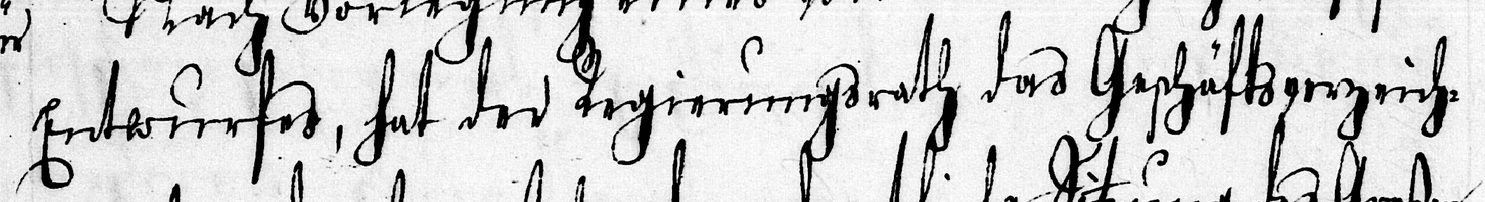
Entwurfes, hat der Regierungsrath das Geschäftsverzeich¬
